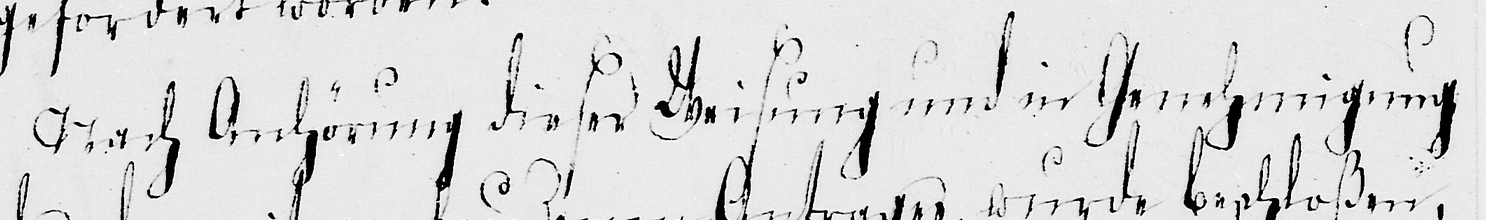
Nach Anhörung dieser Weisung und in Genehmigung
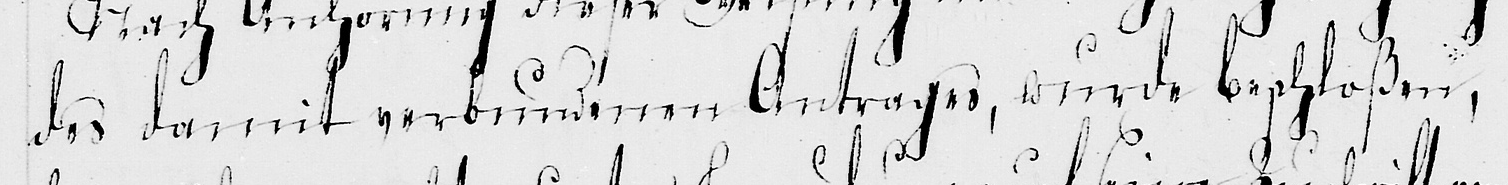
des damit verbundenen Antrages, wurde beschloßen,
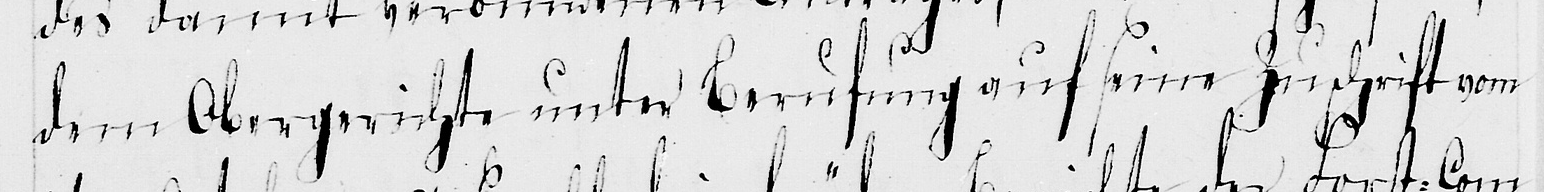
dem Obergerichte unter Berufung auf seine Zuschrift vom
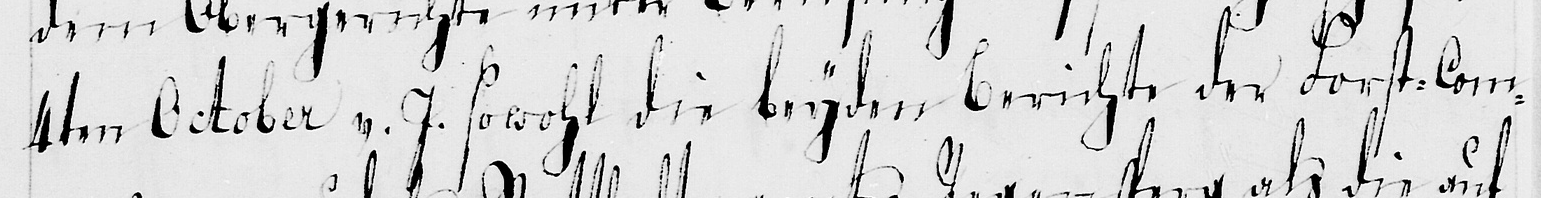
4ten October v. J. sowohl die beyden Berichte der Forst-Com¬
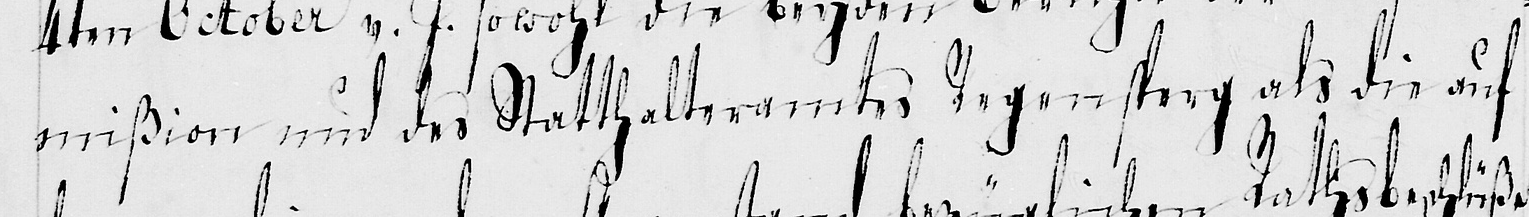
mißion und des Statthalteramtes Regensperg als die auf
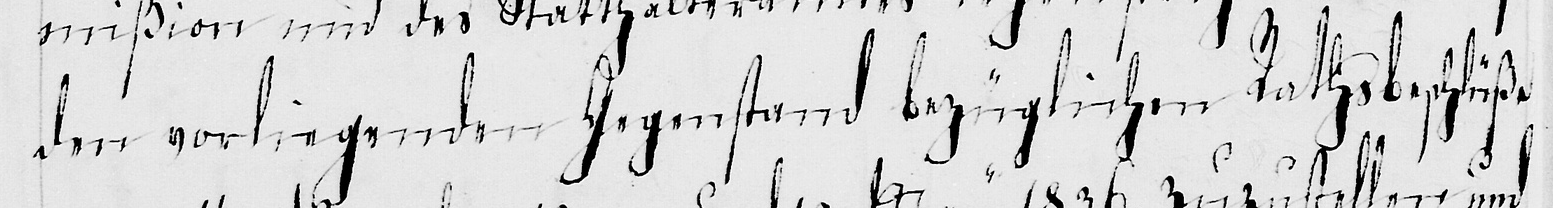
den vorliegenden Gegenstand bezüglichen Rathsbeschlüße
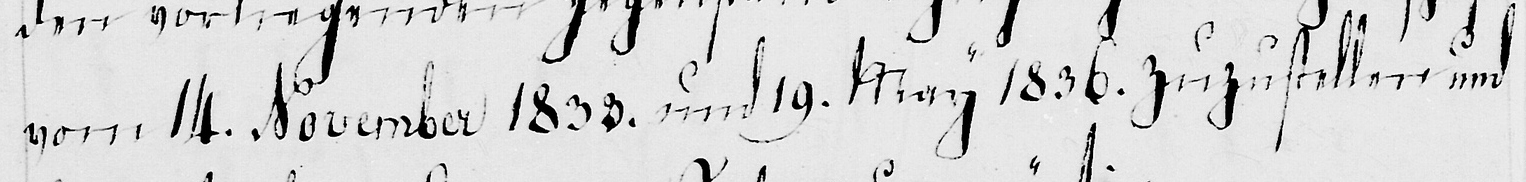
vom 14. November 1833. und 19. May 1836. zuzustellen und
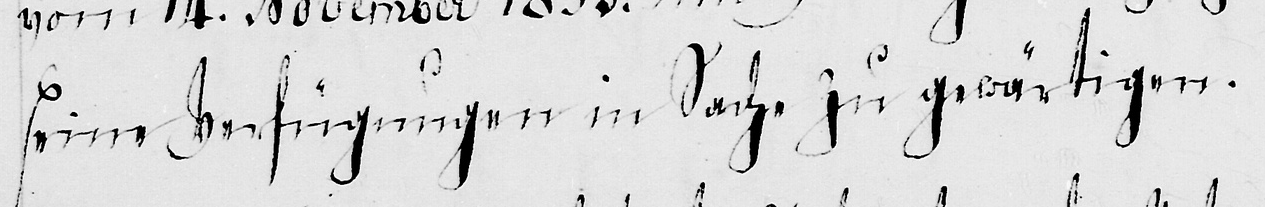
seine Verfügungen in Sache zu gewärtigen.
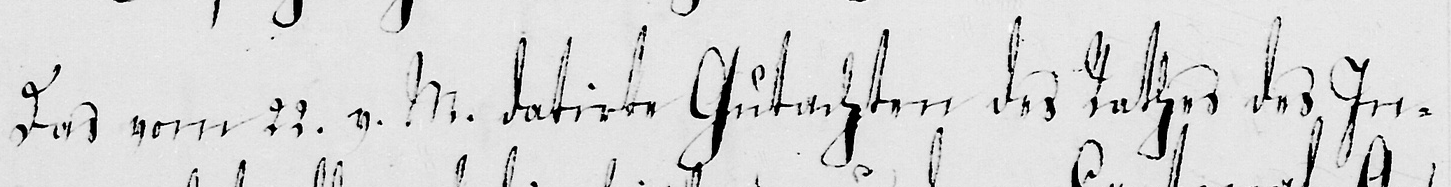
Das vom 22 v. M. datirte Gutachten des Rathes des In¬
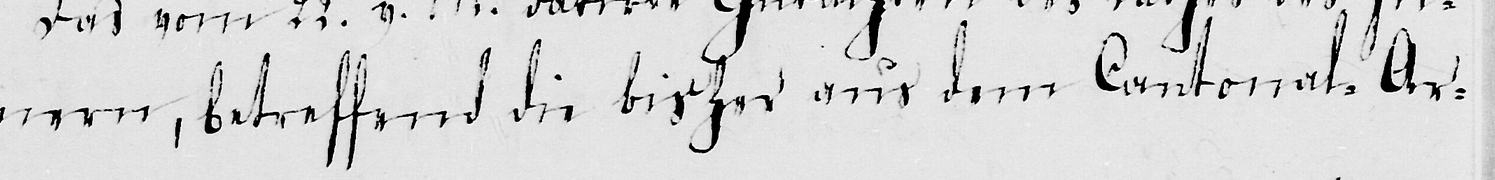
nern, betreffend die bisher aus dem Cantonal-Ar-
